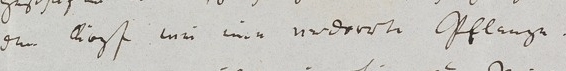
den Kopf wie eine verdorrte Pflanze.
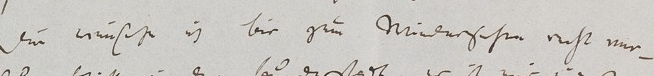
Dir wünsche ich bis zum Wiedersehen recht ver-
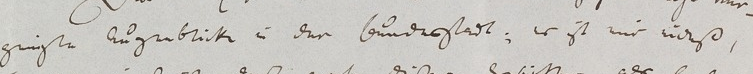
gnügte Augenblicke in der Bundesstadt; es ist mir indeß,
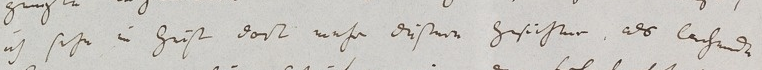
ich sehe im Geist dort mehr düstere Gesichter, als lachende
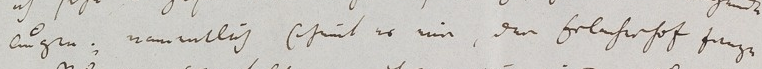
Augen; namentlich scheint es mir, der Erlacherhof fange
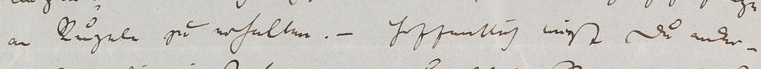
an Runzeln zu erhalten. – Hoffentlich wirst Du ander-
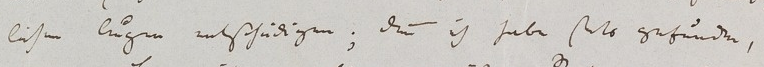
lichen Augen entschädigen; denn ich habe stets gefunden,
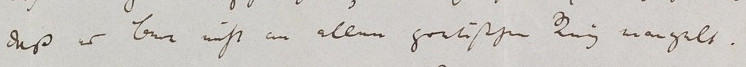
daß es Bern nicht an allem poetischen Reiz mangelt.
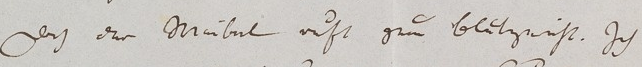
Doch der Weibel ruft zum Blutgericht. Ich
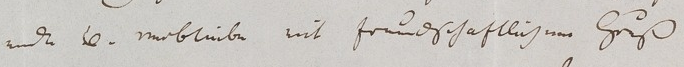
ende &. verbleibe mit freundschftlichem Gruß
